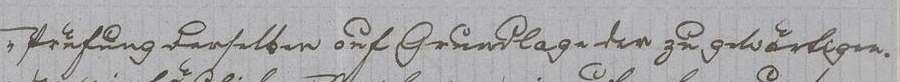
Prüfung derselben auf Grundlage der zu gewärtigen-
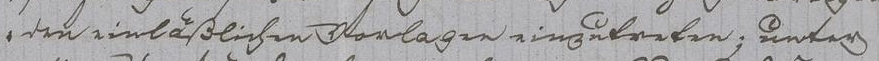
den einläßlichen Vorlagen einzutreten; unter
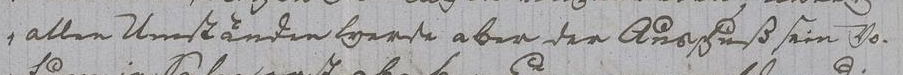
allen Umständen werde aber der Ausschuß sein Vo-
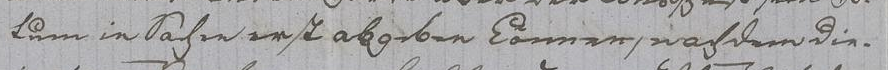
tum in Sachen erst abgeben können, nachdem die-
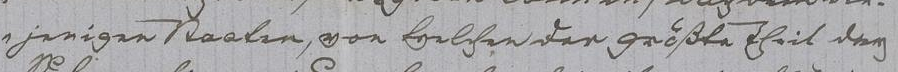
jenigen Staaten, von welchen der größte Theil der
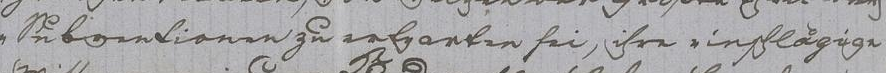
Subventionen zu erwarten sei, ihre einschlägige
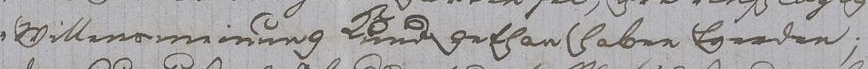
Willensmeinung Kund gethan haben werden;
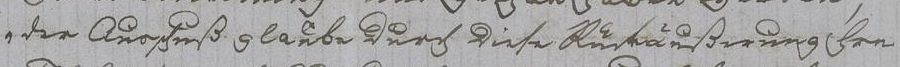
der Ausschuß glaube durch diese Rückäußerung Hrn
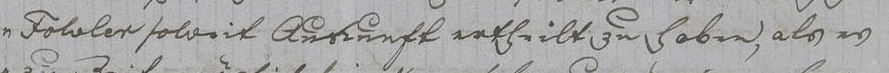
Fowler soweit Auskunft ertheilt zu haben, als es
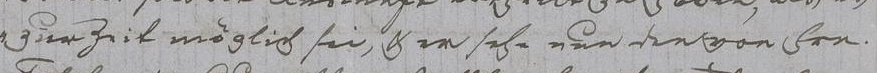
zur Zeit möglich sei, & er sehe nun den von Hrn.
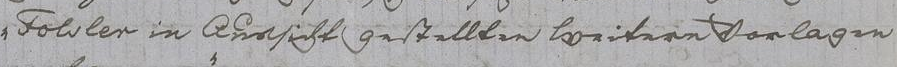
Fowler in Aussicht gestellten weitern Vorlagen
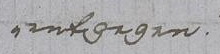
entgegen.»
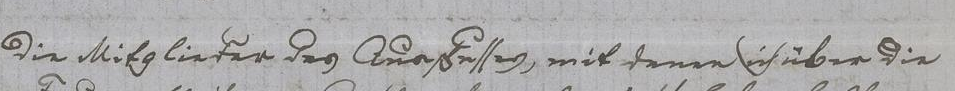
Die Mitglieder des Ausschusses, mit denen ich über die
